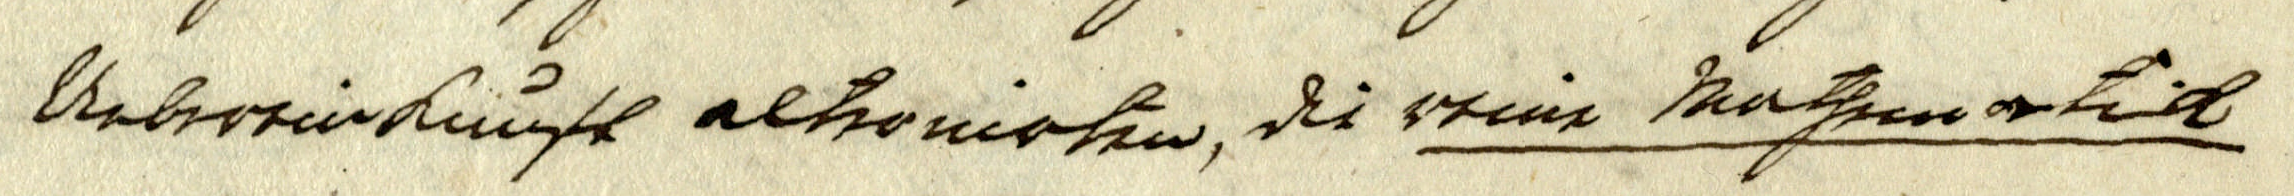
Uebereinkunft alternirten, die reine Mathematik
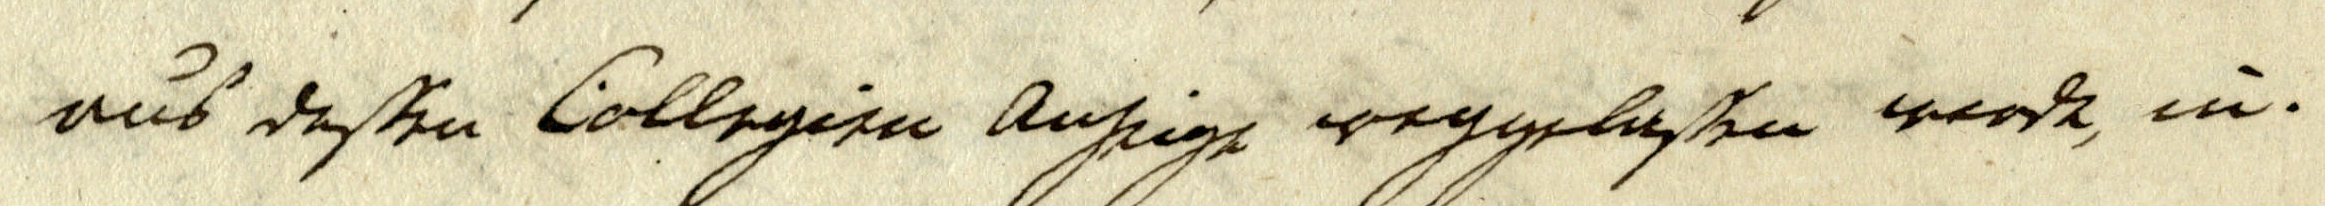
aus dessen Collegien Anzeige weggelassen werde, in¬
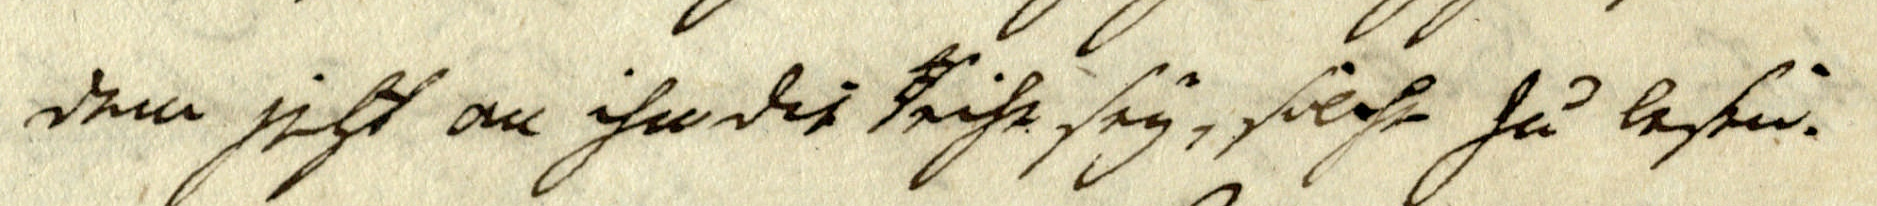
dem jetzt an ihn die Reihe seÿ, solche zu lesen.
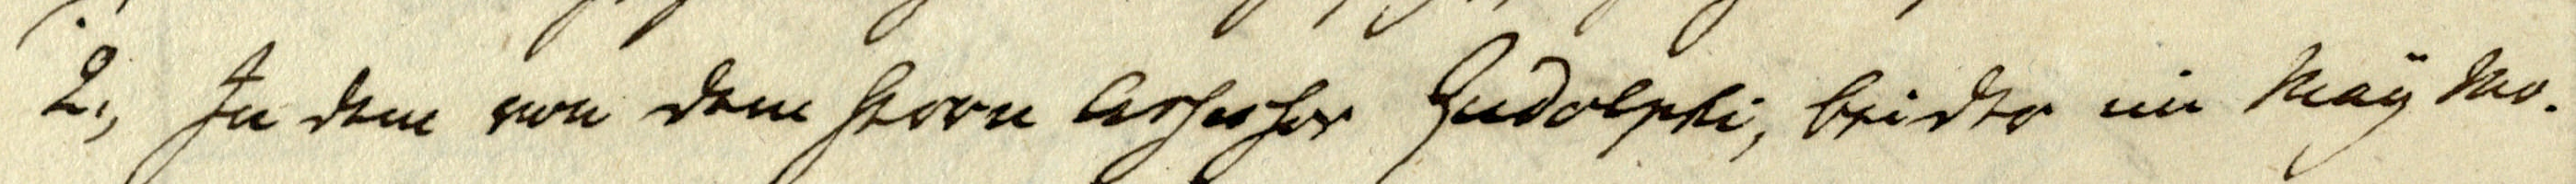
2., In dem von dem herrn Assesor Rudolphi, bei der im Maÿ Mo¬
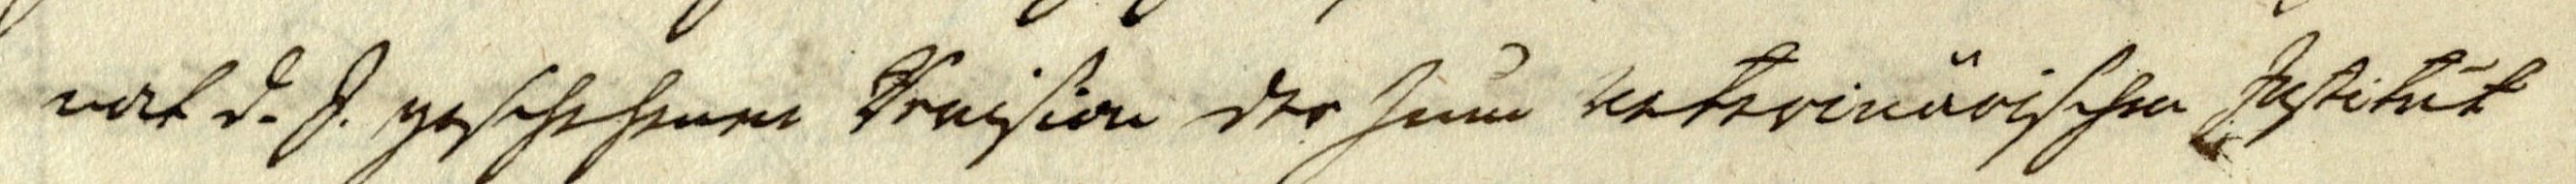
nat d. J. geschehenen Revision der zum veterinärischen Institut
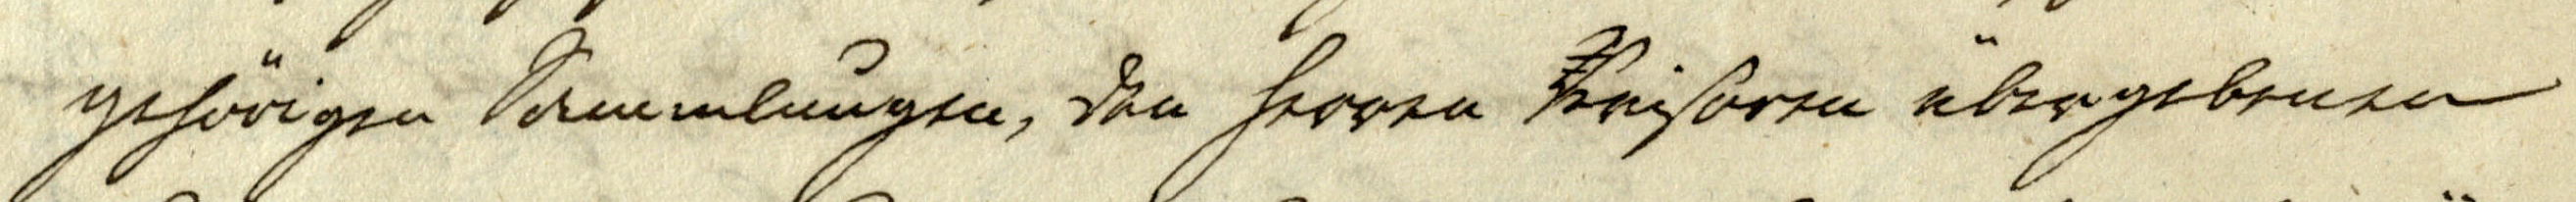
gehörigen Sammlungen, den herren Revisoren übergebenen
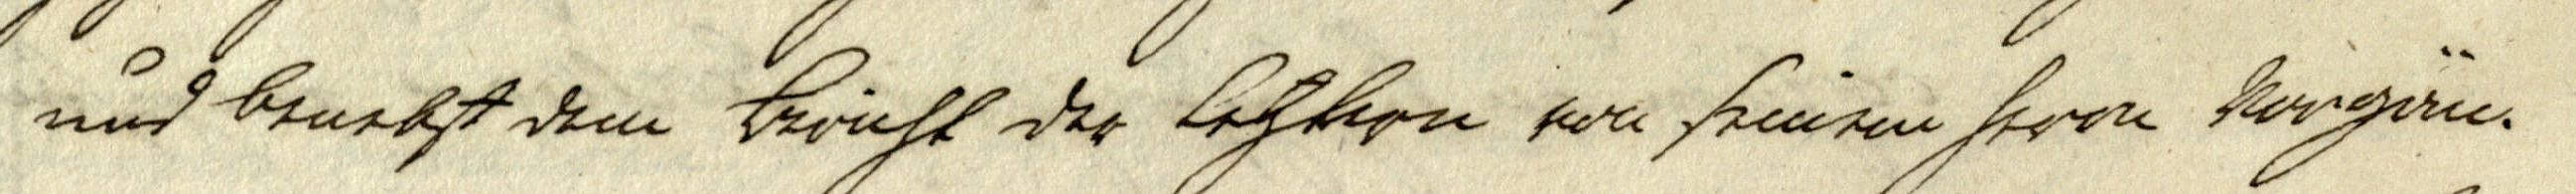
und benebst dem Bericht der letztern von seinem herrn Vorgän¬
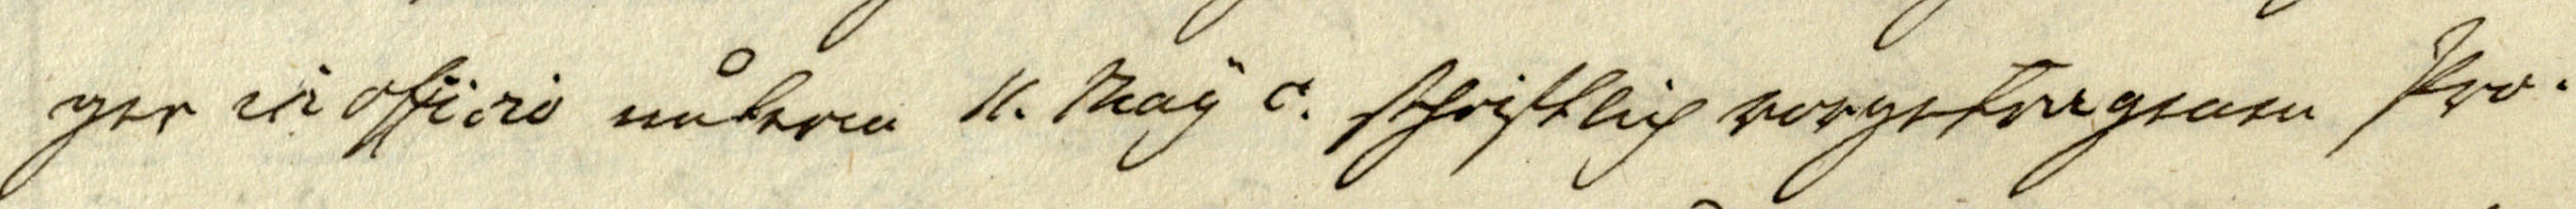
ger in officio unterm 11. Maÿ c. schriftlich vorgetragenen Pro¬
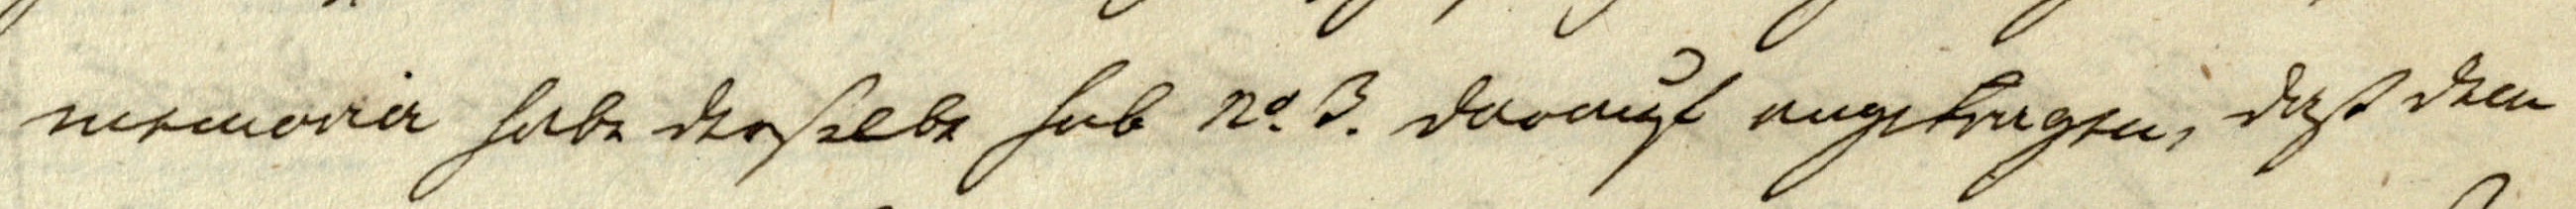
memoria habe derselbe sub nº. 3. darauf angetragen, daß dem
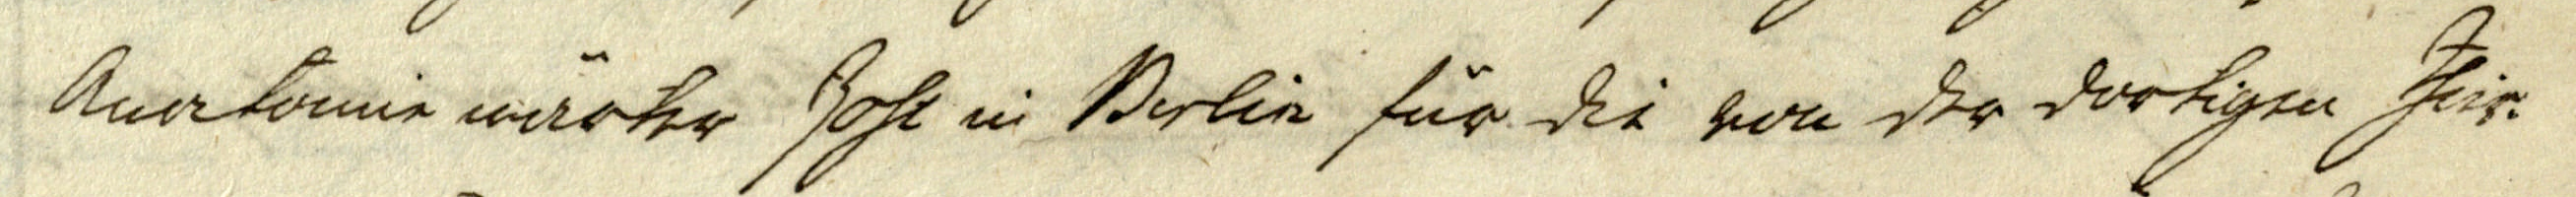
Anatomie wärter Rost in Berlin für die von der dortigen Thier¬
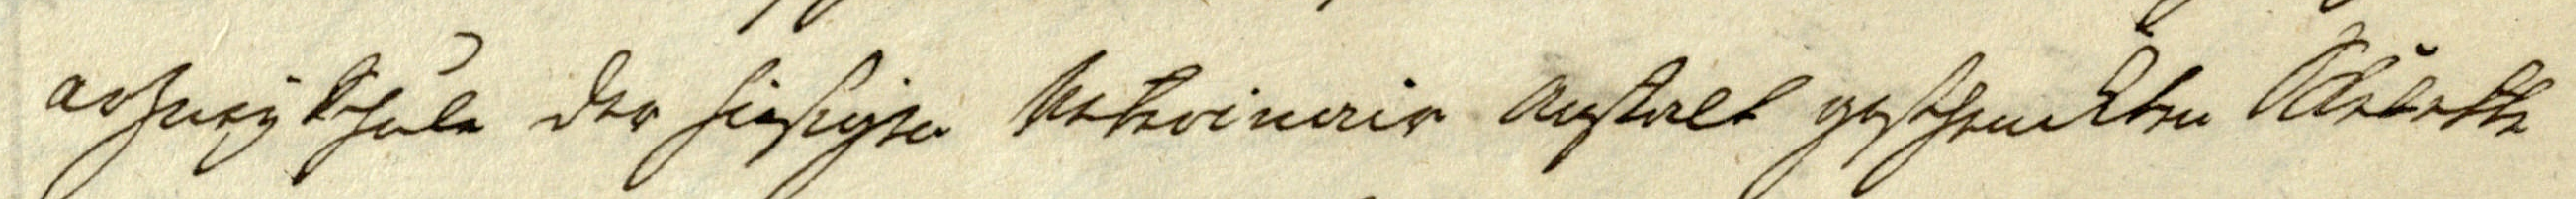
arzneÿ Schule der hiesigen Veterinair Anstalt geschenckten Skelette
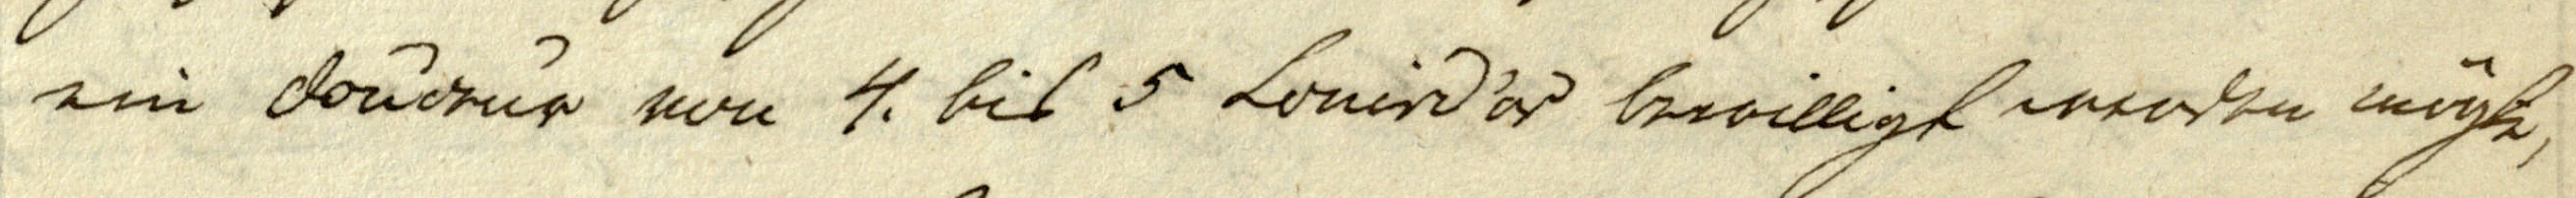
ein douceur von 4. bis 5 Louisd 'or bewilligt werden mögte,
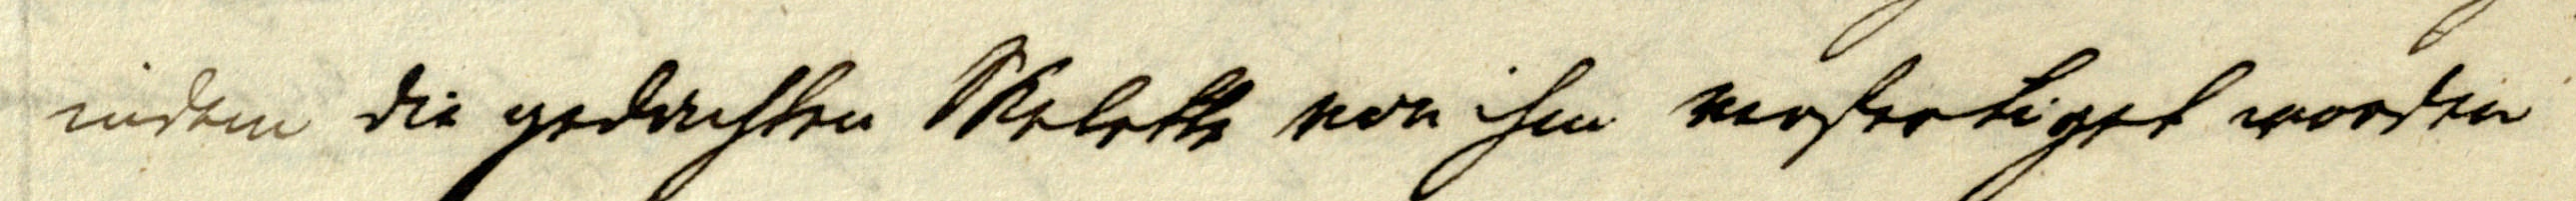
indem die gedachten Skelette von ihm verfertiget worden
